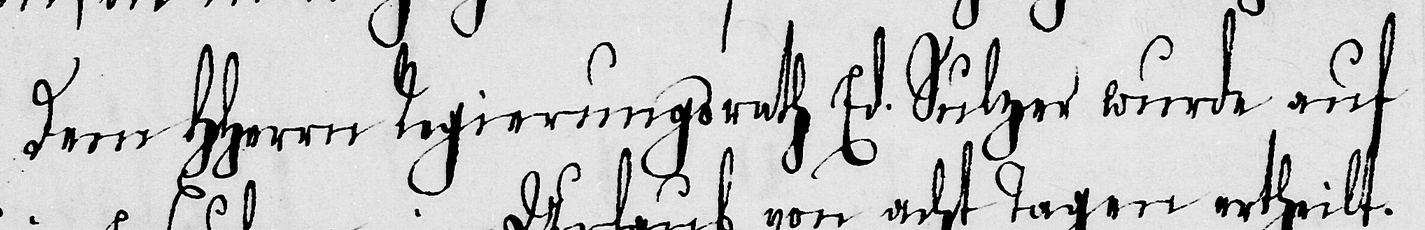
Dem HHerrn Regierungsrath Ed. Sulzer wurde auf
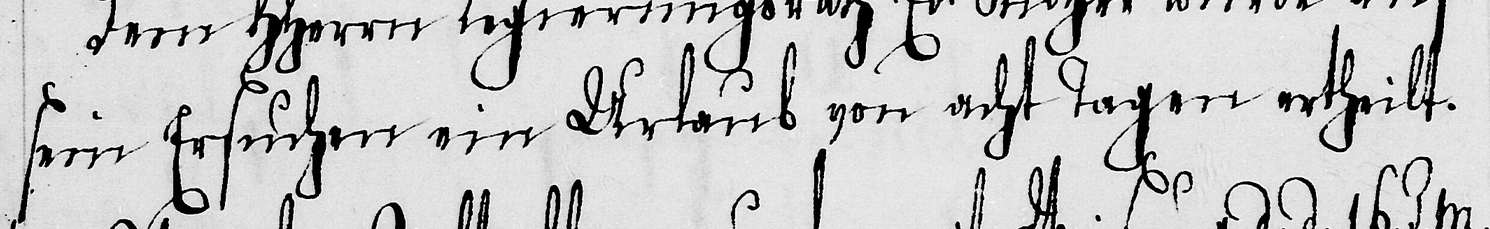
sein Ersuchen ein Urlaub von acht Tagen ertheilt.
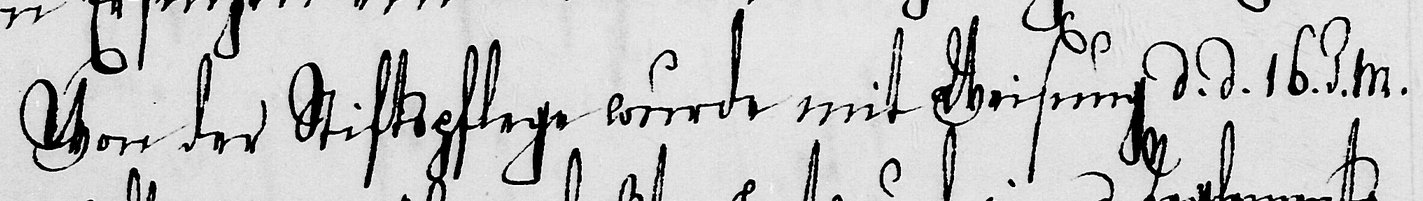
Von der Stiftspflege wurde mit Weisung d.d. 16. d.
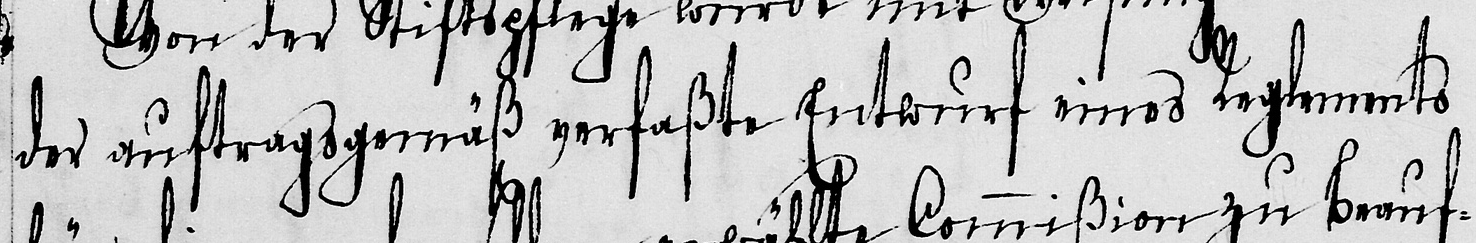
der auftragsgemäß verfaßte Entwurf eines Reglements
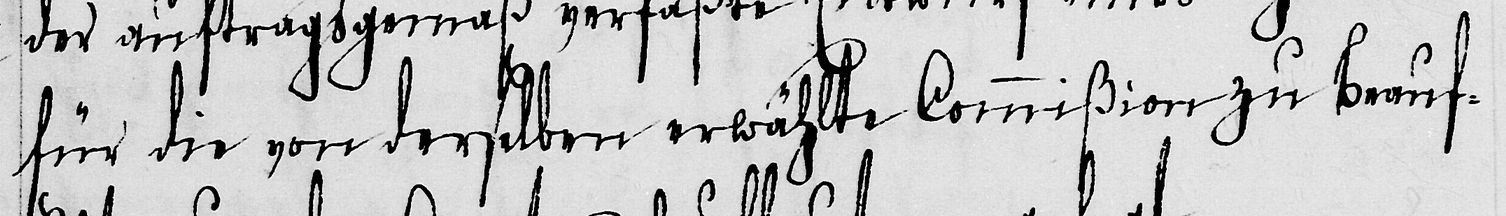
für die von derselben erwählte Commißion zu Beauf¬
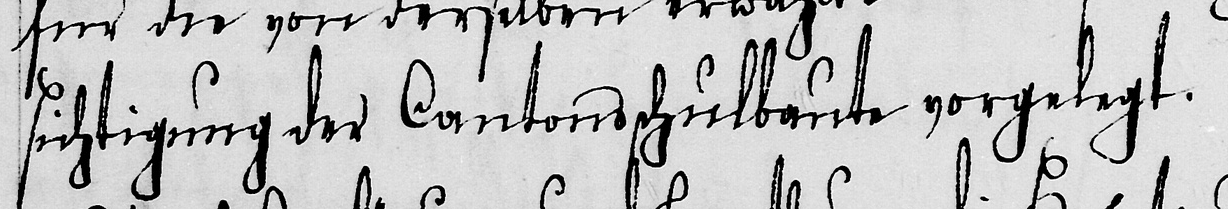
sichtigung der Cantonsschulbaute vorgelegt.
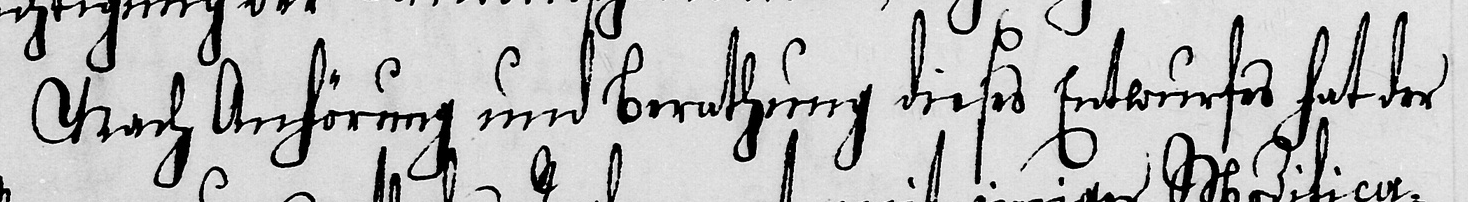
Nach Anhörung und Berathung dieses Entwurfes hat der
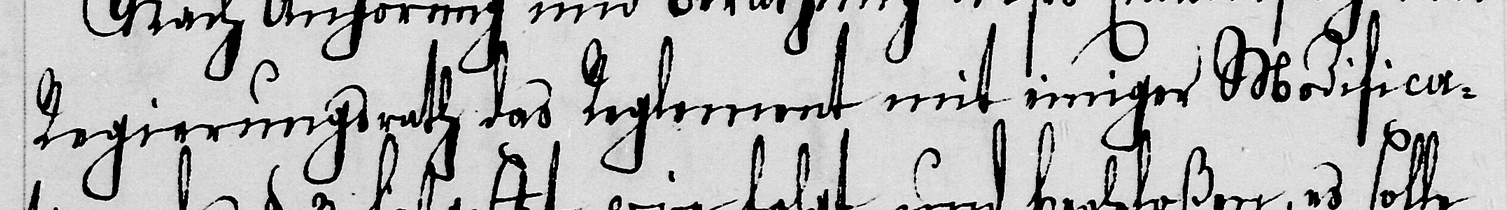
Regierungsrath das Reglement mit einiger Modifica¬
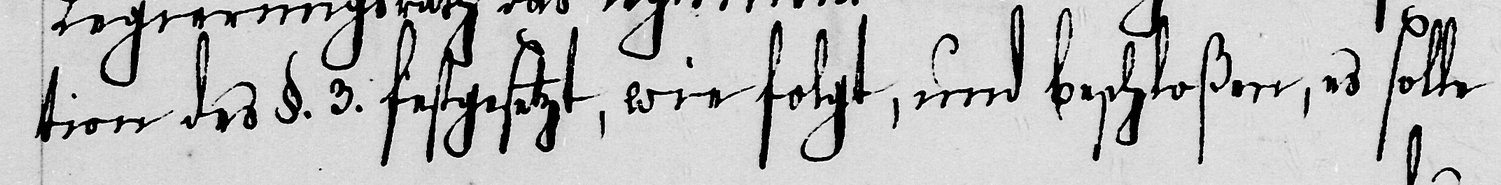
tion des §. 3. festgesetzt, wie folgt, und beschloßen, es solle
